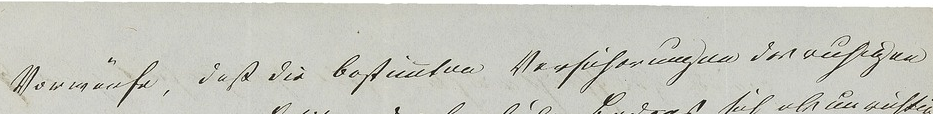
Vorwürfe, daß die bestimmten Versicherungen des ruhigen
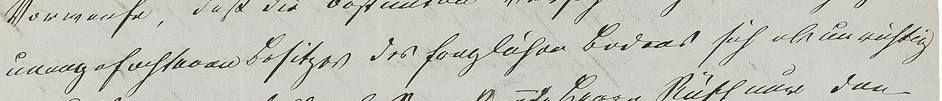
unangefochtenen Besitzes des fraglichen Bodens sich als unrichtig
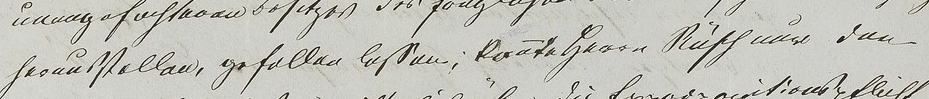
herausstellen, gefallen lassen; konnte Herrn Rüsch nur den
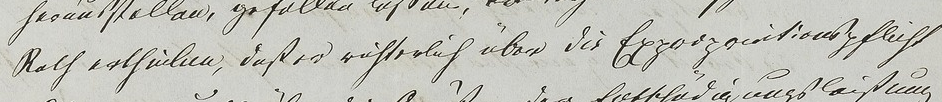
Rath ertheilen, daß er richterlich über die Expropriationspflicht
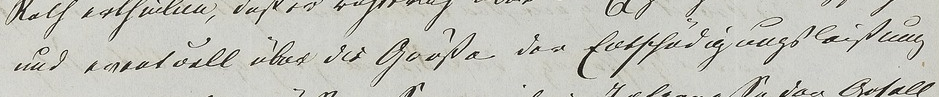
und eventuell über die Größe der Entschädigunsleistung
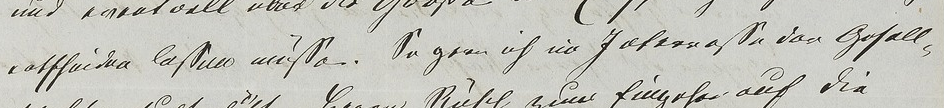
entscheiden lassen müsse. So gern ich im Interresse der Gesell-
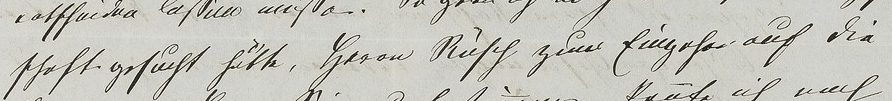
schaft gesucht hätte, Herrn Rüsch zum Eingehen auf die
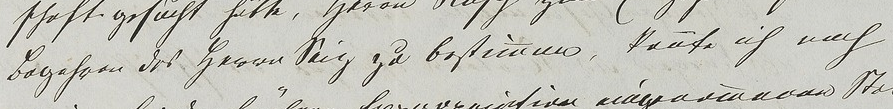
Begehren des Herrn Seiz zu bestimmen, konnte ich nach
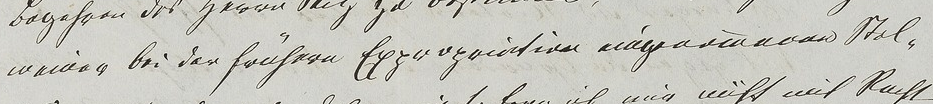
meiner bei der frühern Expropriation eingenommenen Stel-
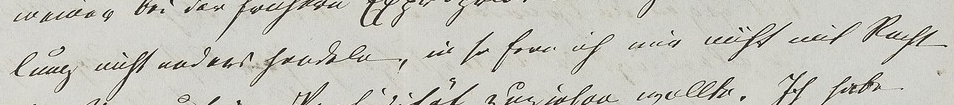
lung nicht anders handeln, in so fern ich mir nicht mit Recht
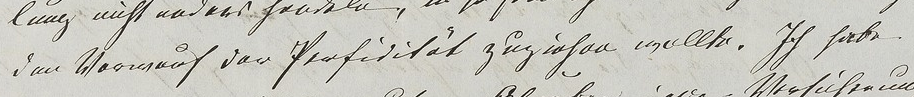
den Vorwurf der Perfidität zuziehen wollte. Ich habe
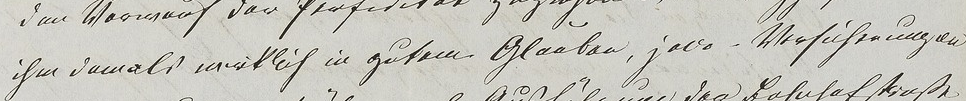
ihm damals wirklich in gutem Glauben, jene Versicherungen
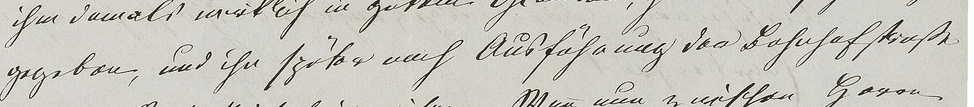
gegeben, und ihn später nach Ausführung der Bahnhofstraße
